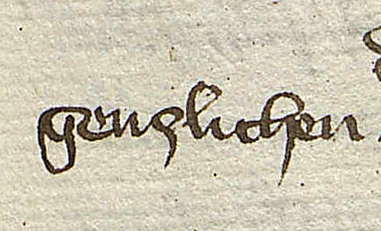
gencʒlichen
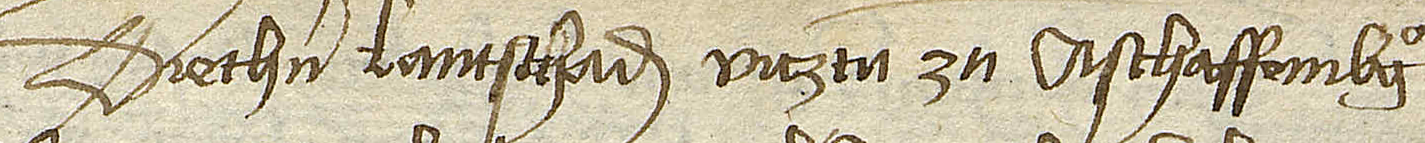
Diethn* lantſchad* vicʒtu* ʒu Aſchaffemb*g
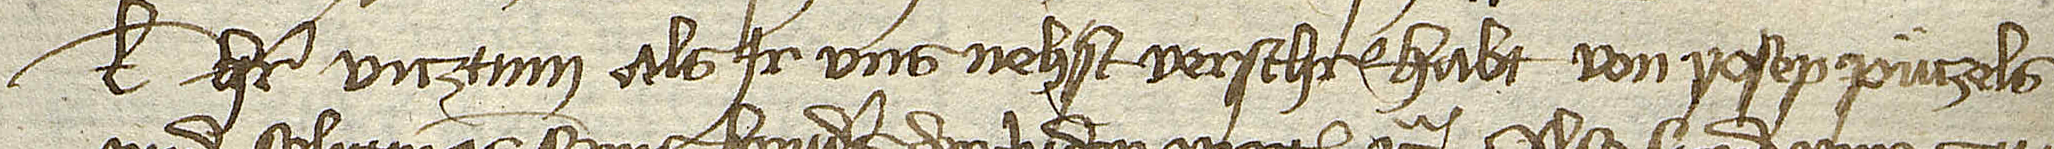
L* hr* vicʒtum als Ir vns nehſt verſchr* habt von Yoſep pücʒels
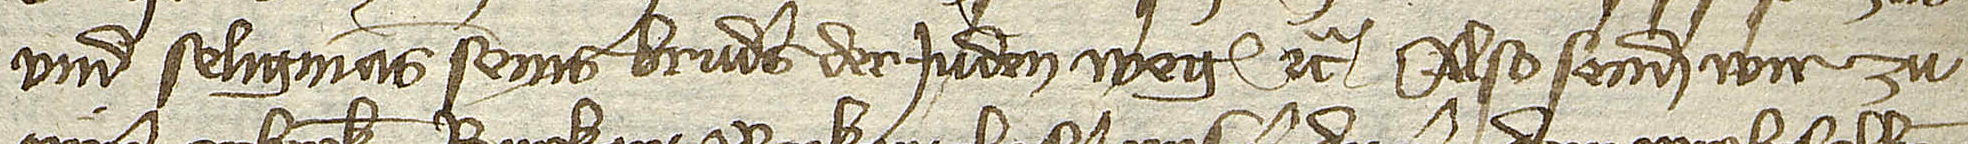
vnd ſeligma*s ſeins brud*s der Iuden weg* ec* Alſo ſend* wir ʒu
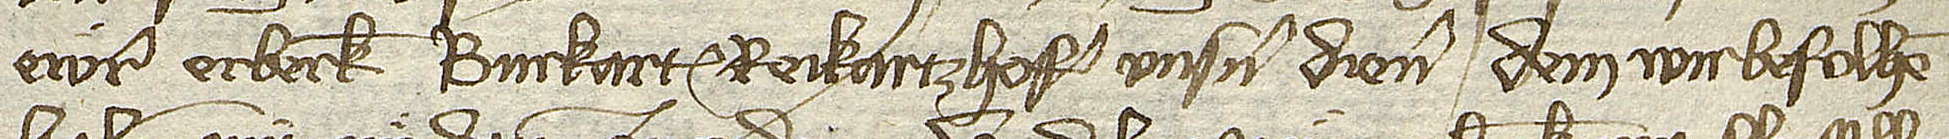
ewr* erberk* Burkart* Reikarcʒhof* vnſ*n dien* dem wir befolhe*
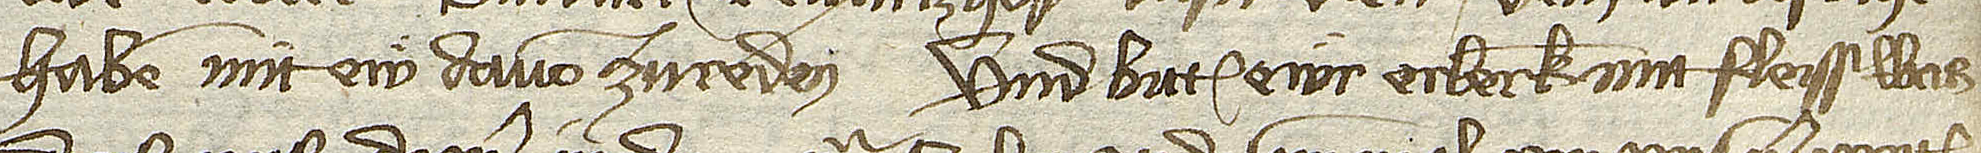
habe* mit ew dauo* ʒureden Vnd bitt* ewr erberk* mit fleiſſ was
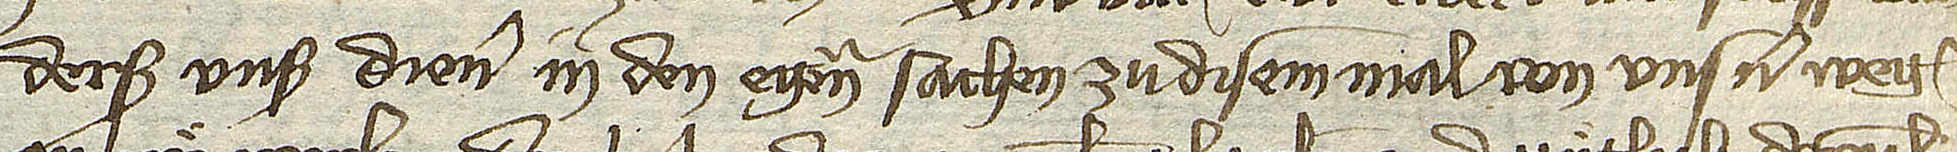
derſ* vnſ* dien* in den egen* ſachen ʒu diſem mal von vnſn* weg*
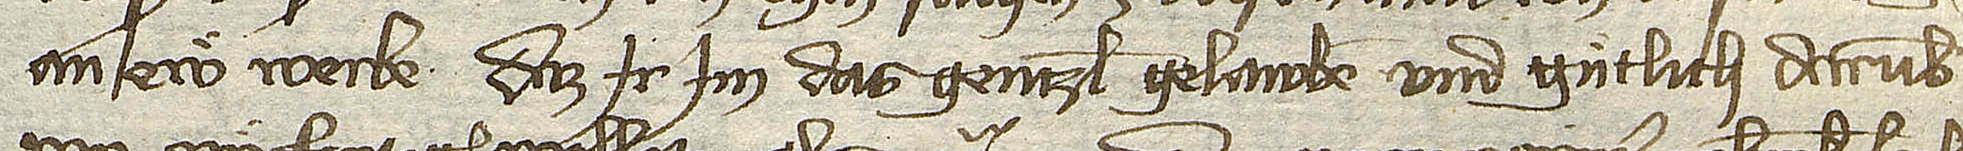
an ew werbe . Daʒ Ir Im das gencʒl* gelawbe* vnd gütlich daru*b
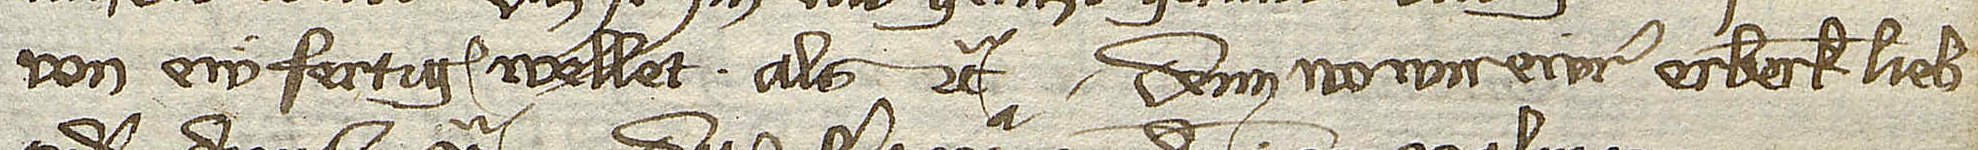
von ew fertig* wellet . als ec* / Denn wo wir ewr* erberk* lieb
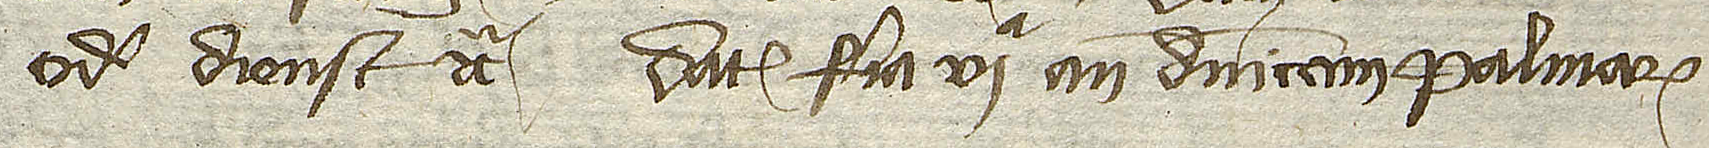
od* dienſt ec* Dat* f*ia vi* an* dnicam* Palma*
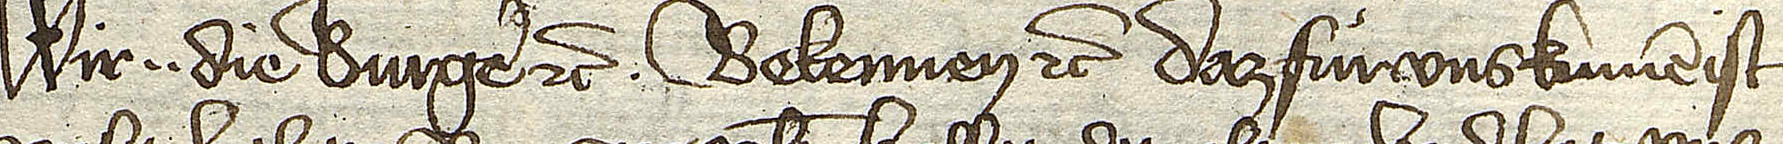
Wir ~ die Burge* ec* . Bekennen ec* daʒ für vns kume* iſt
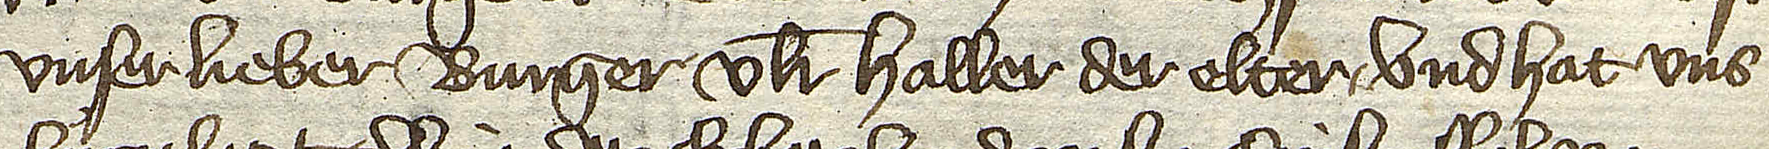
vnſer lieber Burger vlr* haller der elter / vnd hat vns
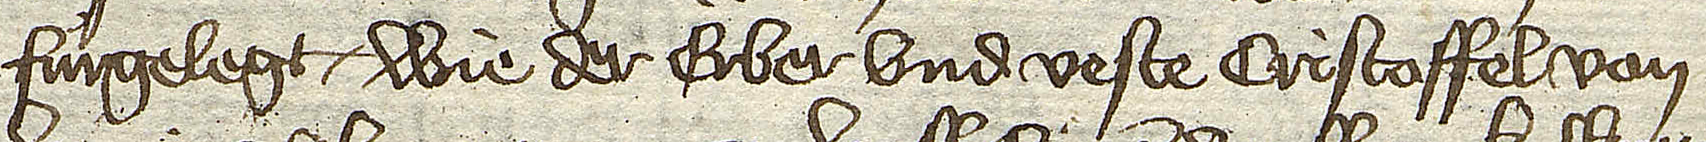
fürgelegt / wie der Erber vnd veſte Criſtoffel von
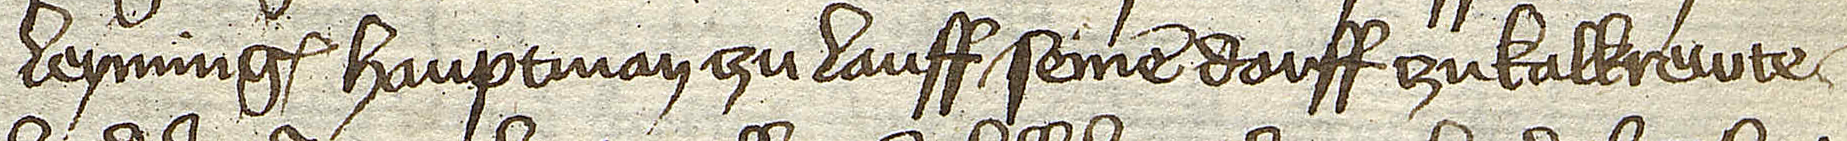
leyming* hauptman cʒu lauff / ſeine* dorff cʒu kalkrewte /
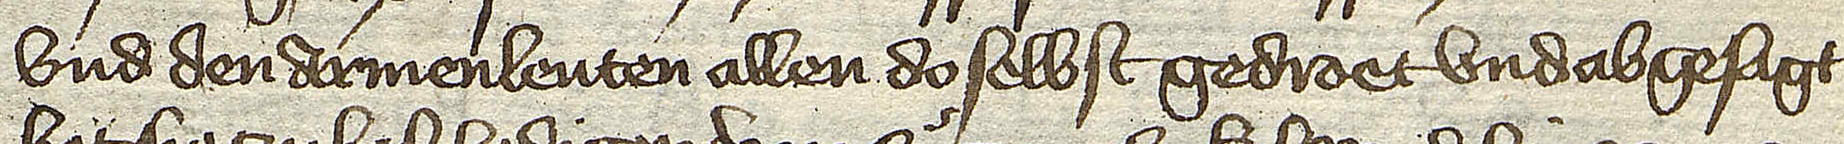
vnd den Armenleuten allen doſelbſt gedroet vnd abgesagt
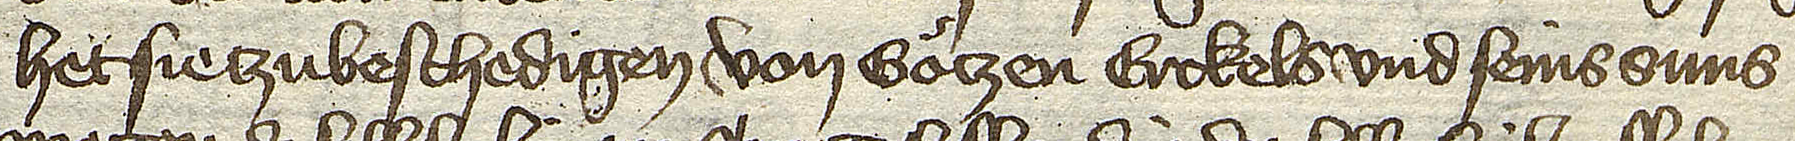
het ſie cʒu beſchedigen / von Göcʒen Erckels vnd ſeins Suns
